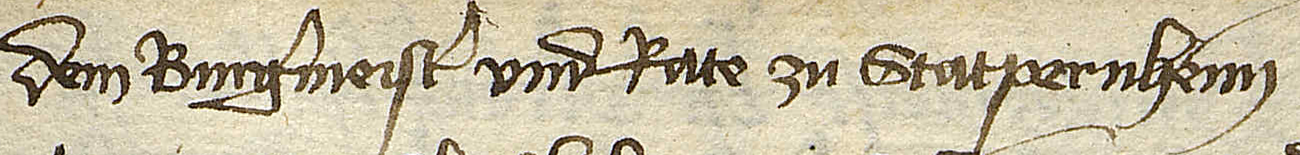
Dem Burg*meiſt* vnd Rate ʒu Statpernheim
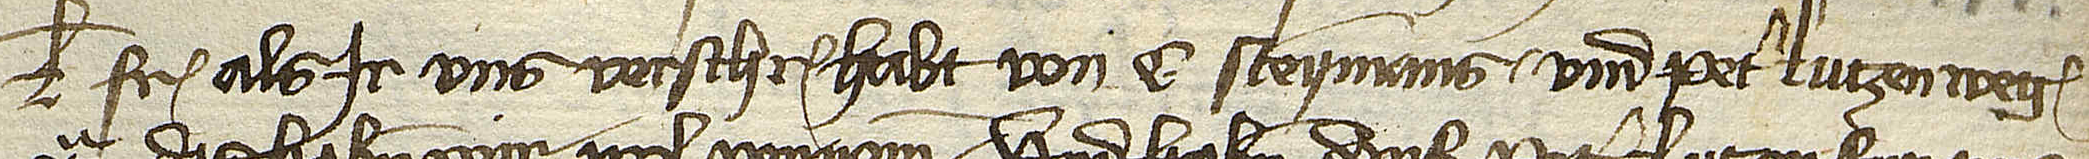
L* fr* als Ir vns verſchr* habt von C . ſtey*mans / vnd Pet* lucʒen weg*
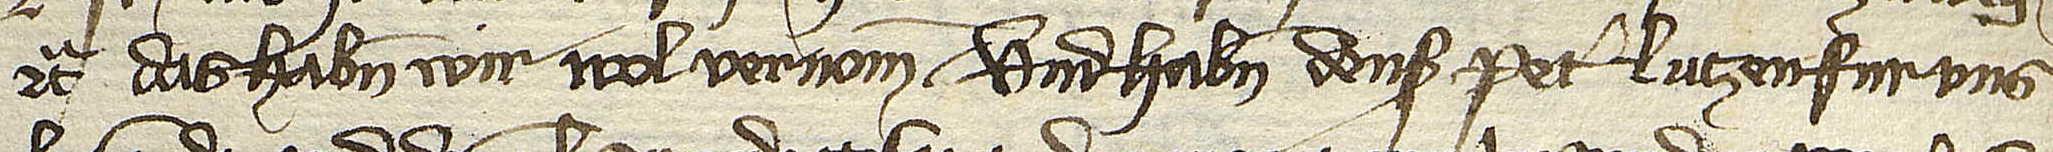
ec* das habn* wir wol vernom* / Vnd habn* denſ* Pet* lucʒen fur vns
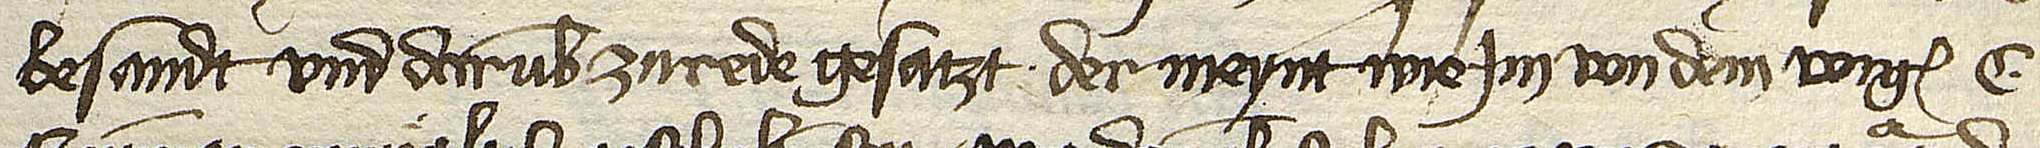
beſandt vnd darub* ʒurede geſacʒt . der meynt wie Im von dem vorg* C .
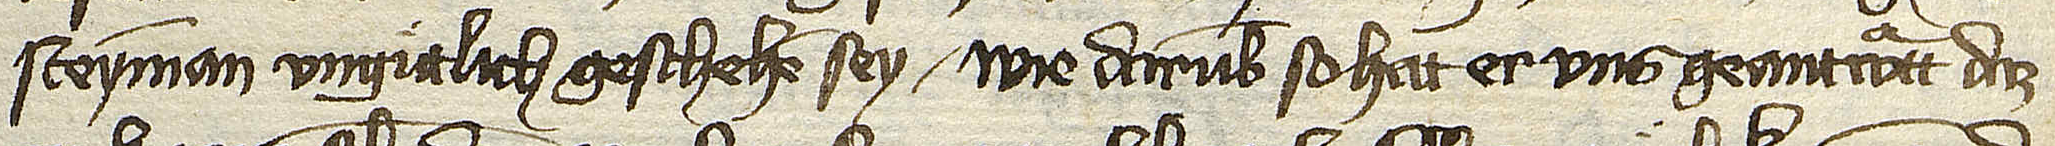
ſtey*man vngütlich geſchehe* ſey / wie darub* ſo hat er vns geantw*tt daʒ
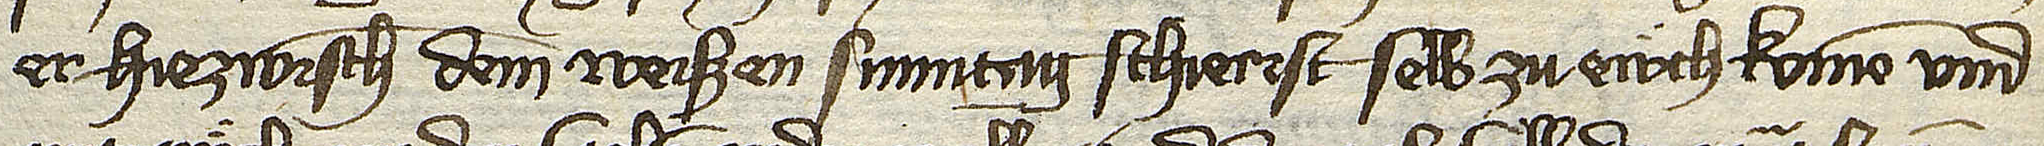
er hieʒwiſch* dem weiſʒen ſunntag ſchieriſt ſelb ʒu eẅch kome* vnd
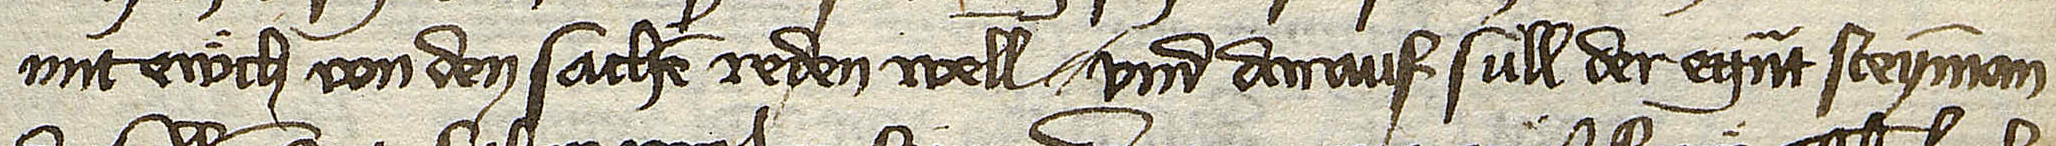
mit eẅch von den ſache* reden well / vnd darauf ſüll der egnt* ſtey*man
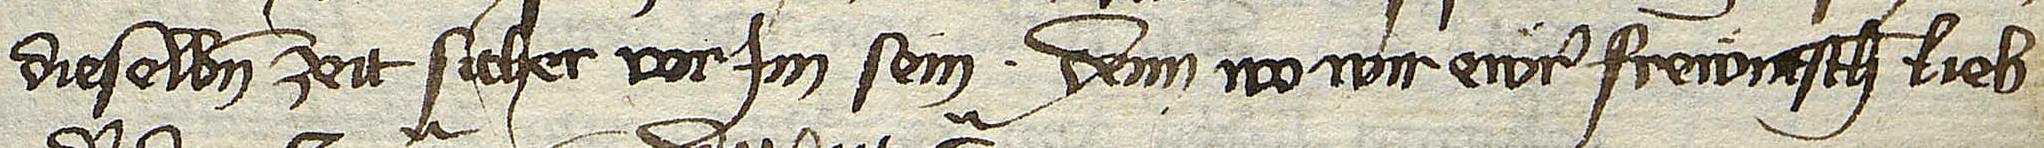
dieſelbn* ʒeit ſicher vor Im ſein . Denn wo wir eẅr* freẅntſch* lieb
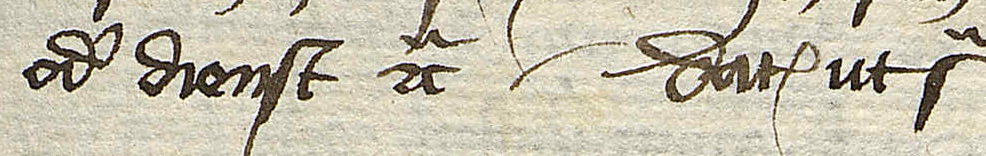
od* dienſt ec* / Dat* ut ſ*
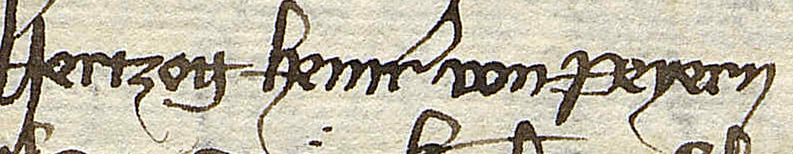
Hercʒog Heinr* von Peyern
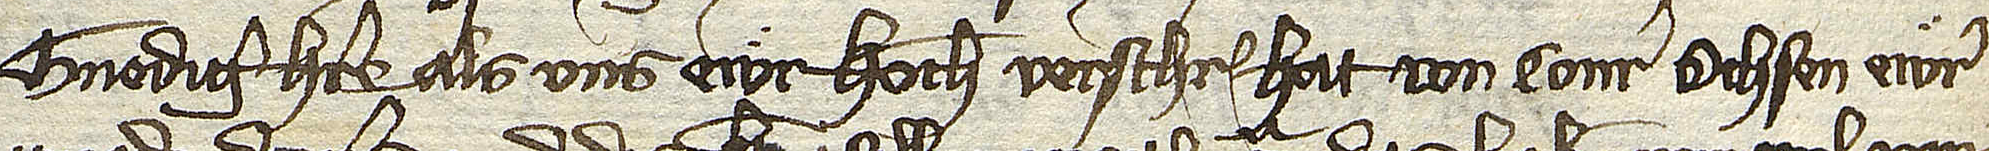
Gnedig* h*re als vns eẅr Hoch* verſchr* hat von Conr* Ochſen eẅr*
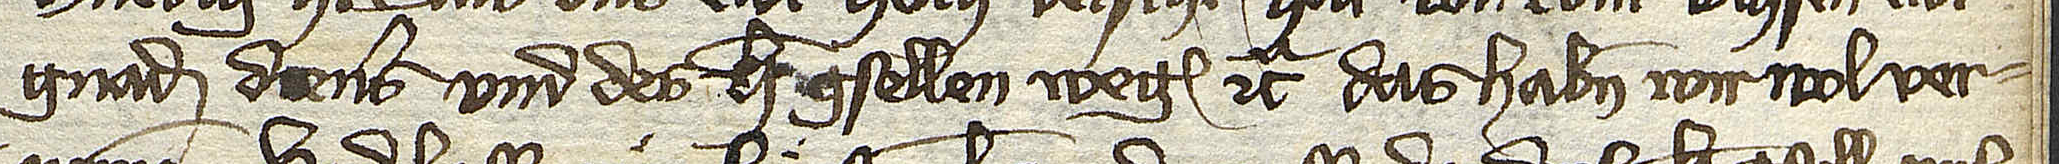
gnad* dien*s vnd des H* geſellen weg* ec* das habn* wir wol ver =
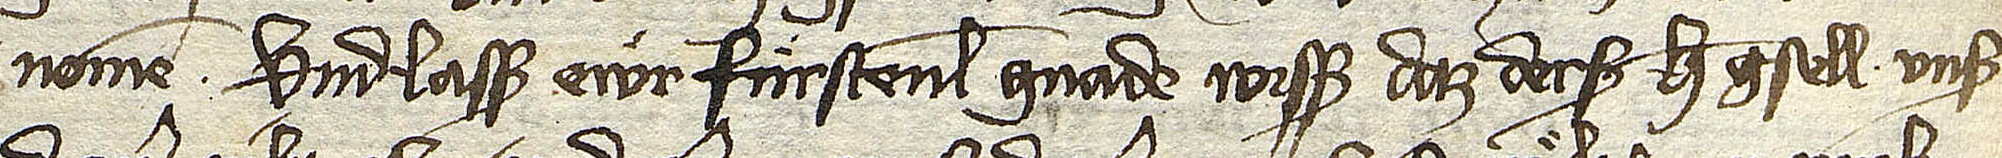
nome* . Vnd laſſ* eẅr fürſtenl* gnade wiſſ* daʒ derſ* H* gſell . vnſ*
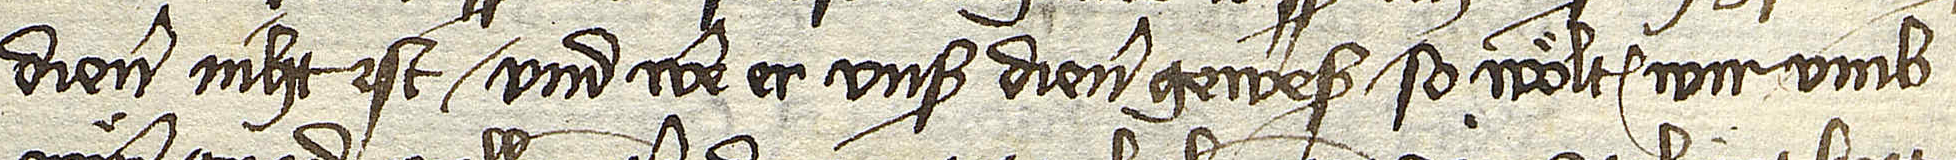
dien* niht iſt / vnd w*e er vnſ* dien* geweſ* / ſo wölt* wir vmb
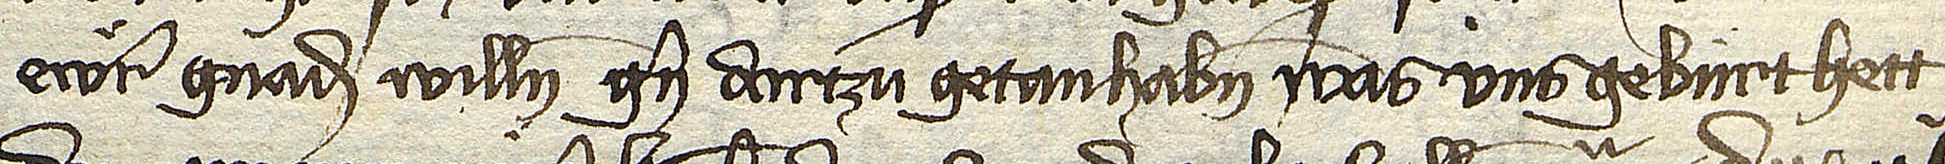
eẅr* gnad* willn* g*n darcʒu getan habn* was vns gebürt hett
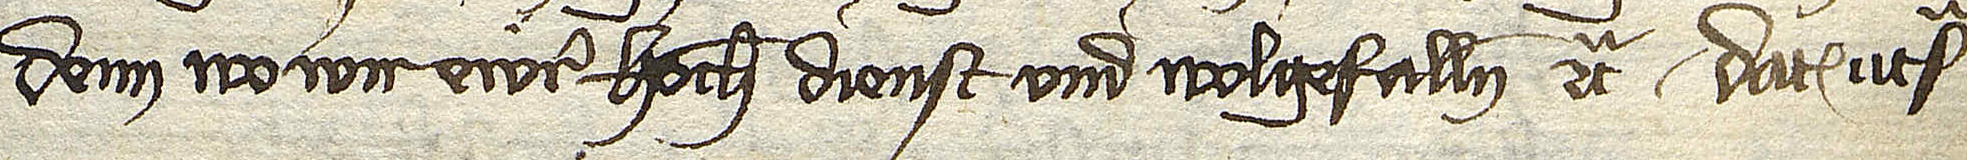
Denn wo wir eẅr* Hoch* dienſt vnd wolgefalln* ec* / Dat* ut ſ*
